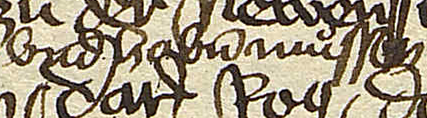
vnd habn* müſſen
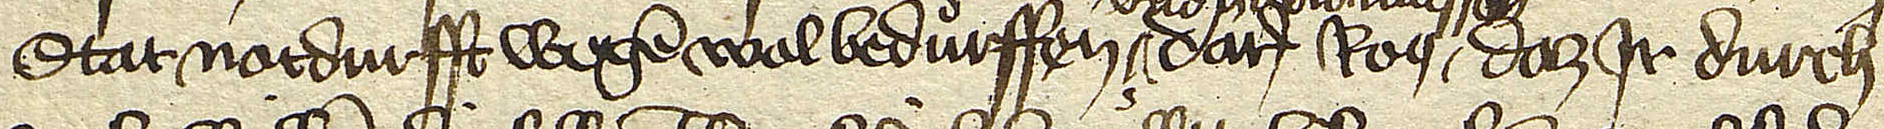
Stat notdurfft wege* wol bedürffen / Dar* Ro* / daʒ Ir durch
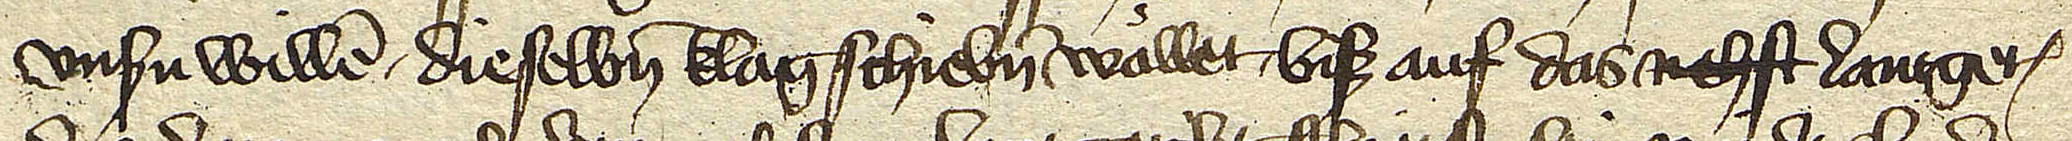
vnſ*n wille* / dieſelbn* klag ſchiebn* wöllet / biſʒ auf das nehſt lantger*
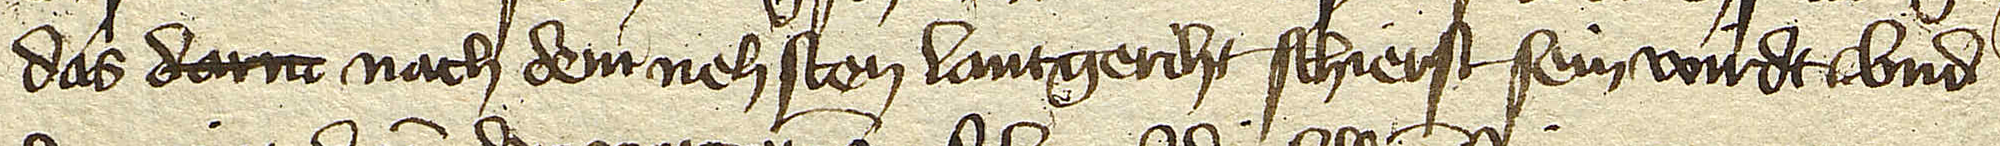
das darn% nach dem nehſten lantgeriht ſchierſt ſein wirdt / vnd
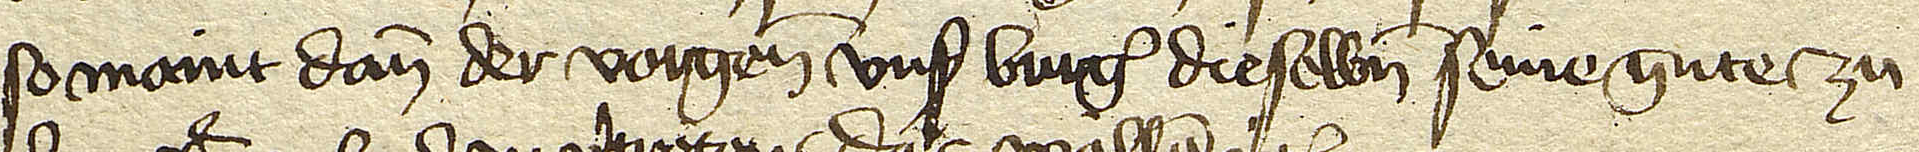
ſo maint dan* der vorgen* vnſ* burg* dieſelbn* ſeine gute cʒu
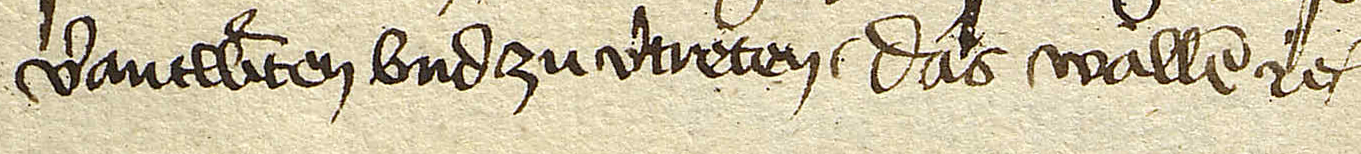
v*antw*ten vnd cʒu v*treten / Das wölle* ec*
